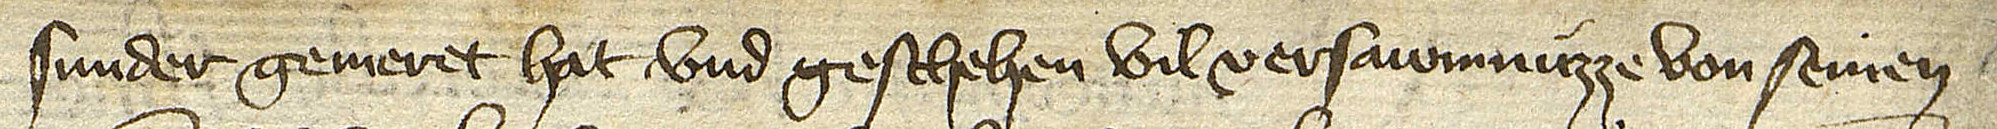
ſunder gemeret hat / vnd geſchehen vil verſawmnüʒʒe von ſeinen
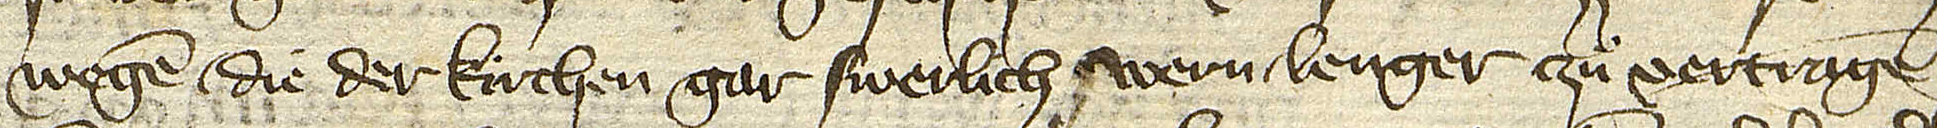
wege* / die der kirchen gar ſwerlich wern / lenger cʒü vertrage*
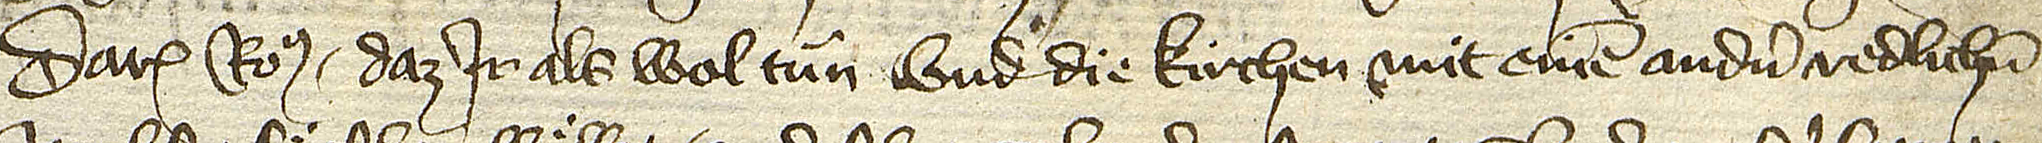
Dar* Ro* / daʒ Ir als wol tün / vnd die kirchen mit eine* andn* redlichn*
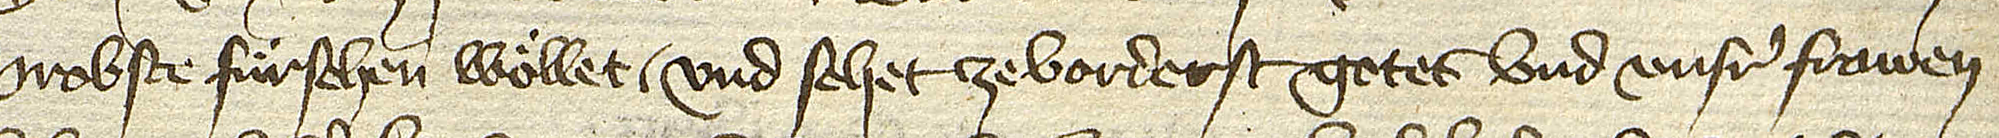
Probſte fürſehen wöllet / vnd ſehet cʒevorderſt gotes vnd vnſr* frawen
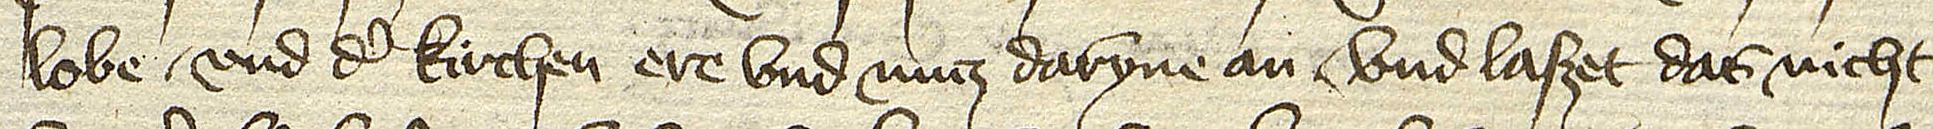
lobe / vnd d* kirchen ere vnd nucʒ dary*ne an / vnd laſʒet das nicht
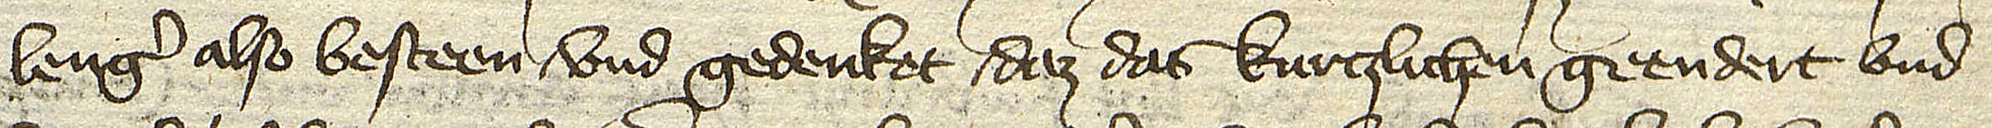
leng* alſo beſteen / vnd gedenket / daʒ das kurcʒlichen geendert vnd
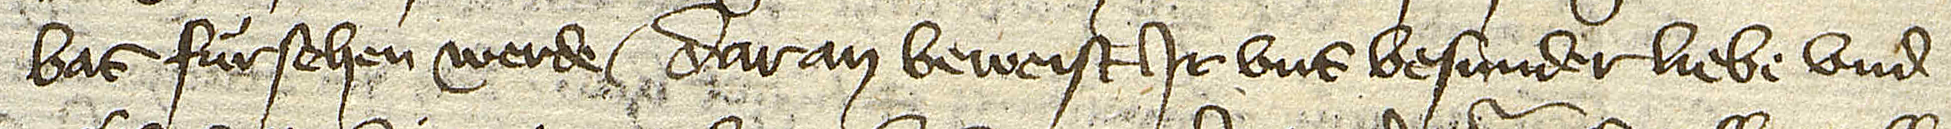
bas fürſehen werde / Daran beweiſt Ir vns beſunder liebe vnd
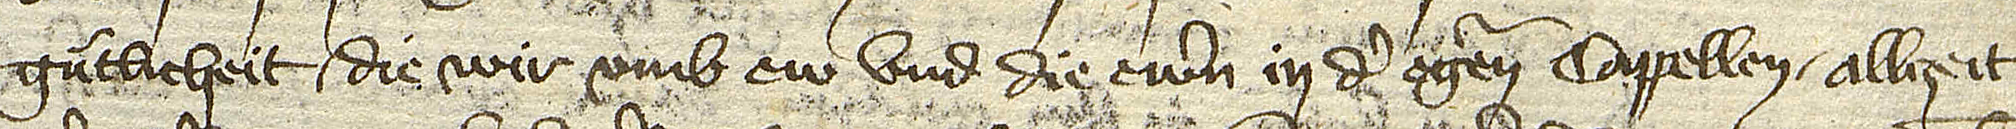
gütlicheit / die wir vmb ew vnd die ew*n in d* egen* Cappellen / allcʒeit
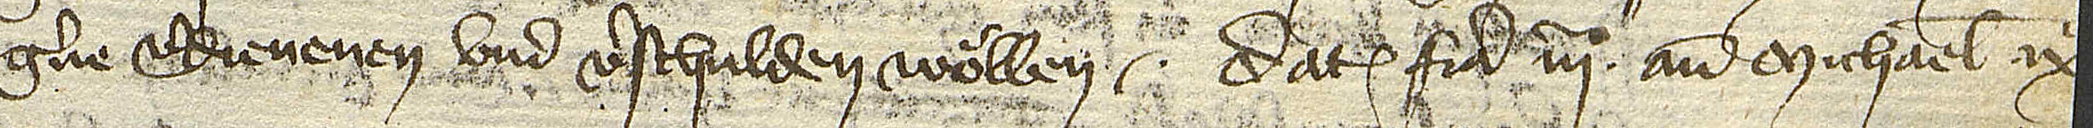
g*ne v*dienenen vnd v*ſchulden wöllen / . Dat* fia* iii* . an* Michael* ix*
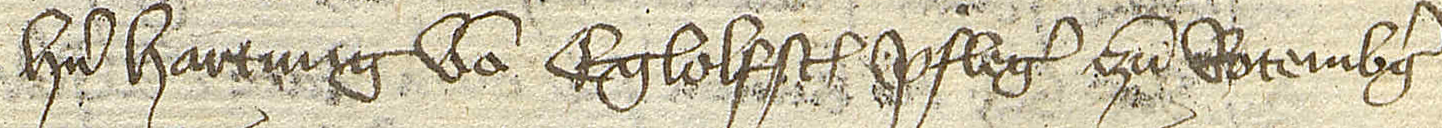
hn* hartung vo* Eglolfſt* Pfleg* cʒu* Rotembg*
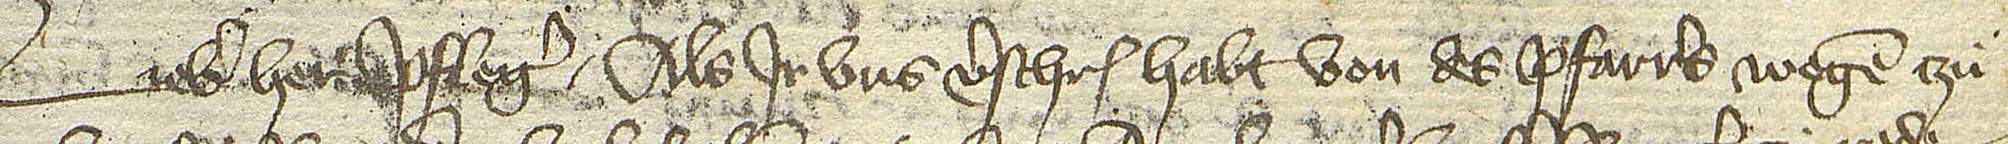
Lieb* her Pfleg* / Als Ir vns v*ſchr* habt von des Pfarr*s wege* cʒü
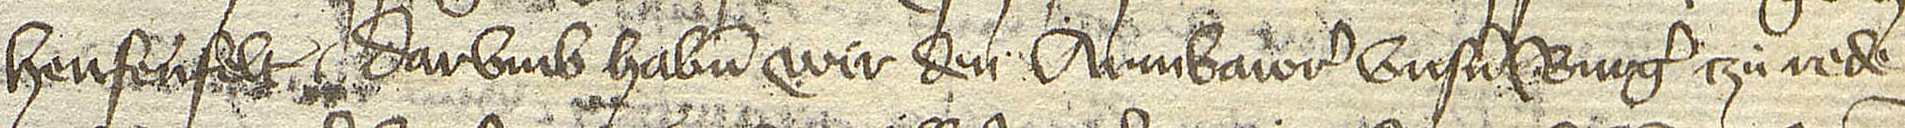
henfenfelt / Darvmb habn* wir den Armbawr* vnſn* Burg* cʒü rede
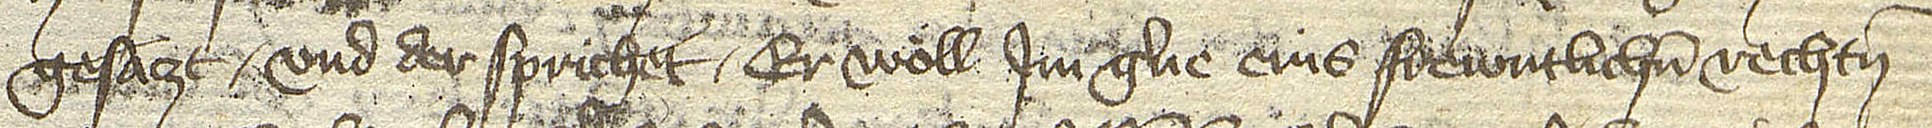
geſacʒt / vnd der ſprichet / Er wöll Im g*ne eins frewntlichn* rechtn*
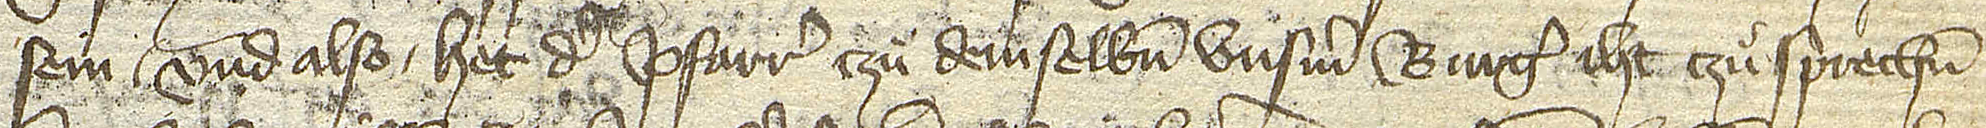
ſein / vnd alſo / het d* Pfarr* cʒü demſelbn* vnſm* Burg* iht cʒüſprechn*
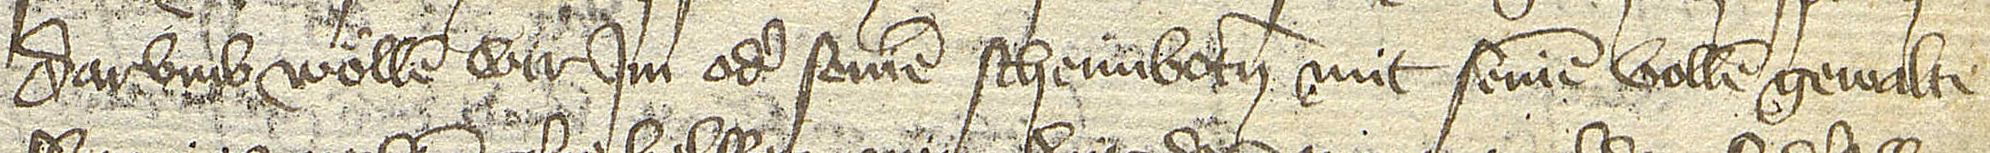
Darvmb wölle* wir Im od* ſeine* ſcheimbotn* mit ſeine* volle* gewalte
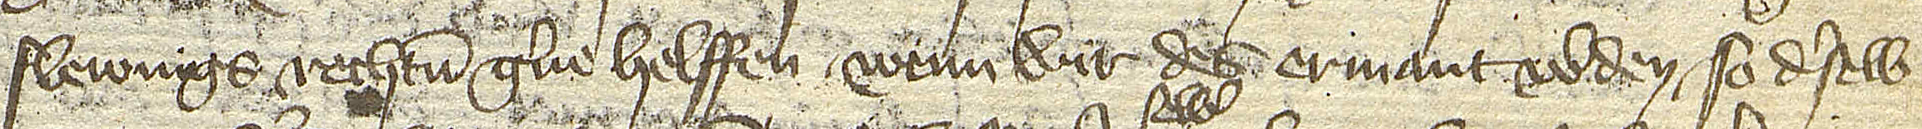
ſlewnigs rechtn* g*ne helffen / wenn wir des ermant w*den / ſo d*ſelb
